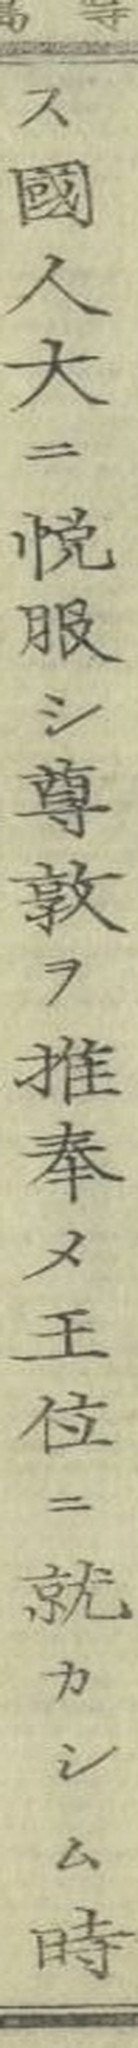ス國人大ニ悦服シ尊敦ヲ推奉シテ王位ニ就カシム時
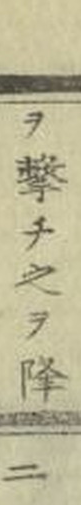ヲ撃チ之ヲ降
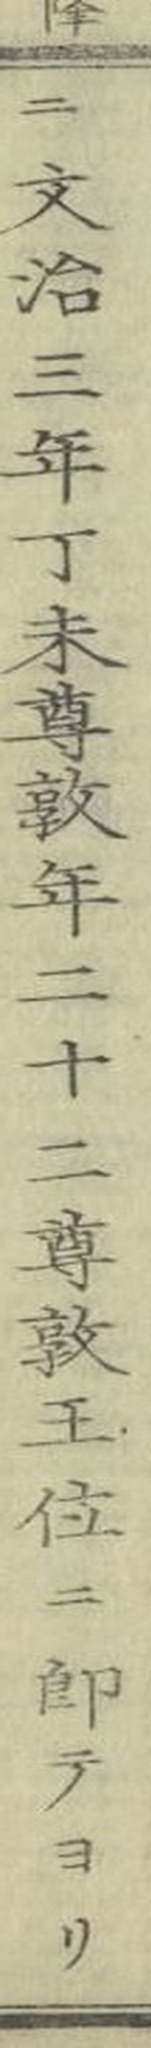ニ文治三年丁未尊敦二十二尊敦王位ニ即テヨリ
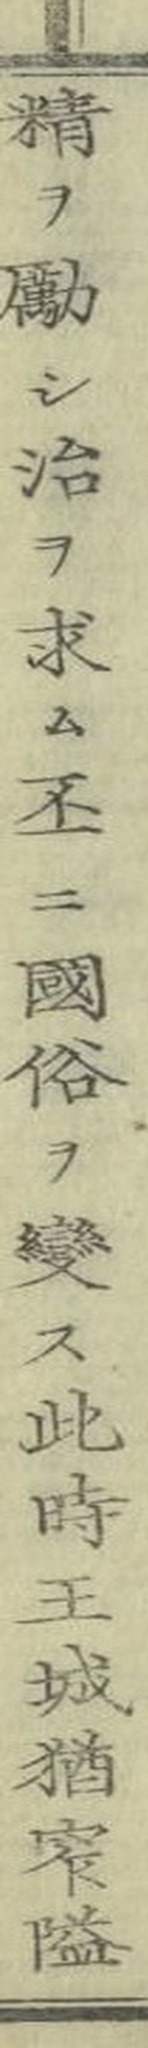精ヲ勵シ治ヲ求ム丕ニ國俗ヲ變ス此時王城猶窄隘
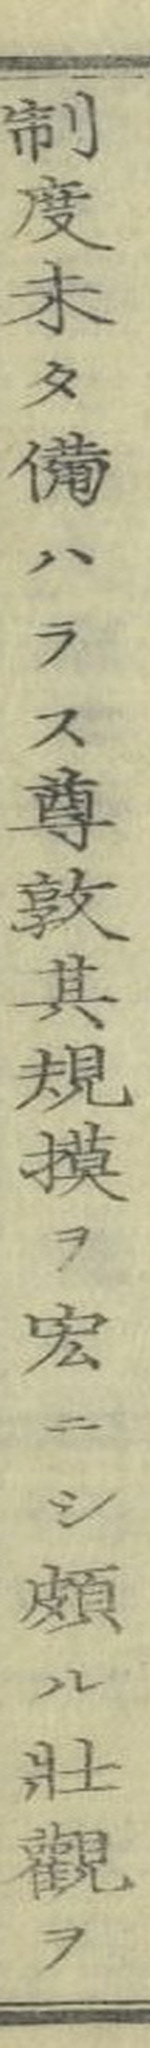制度未タ備ハラス尊敦其規模ヲ宏ニシ頗ル壯觀ヲ

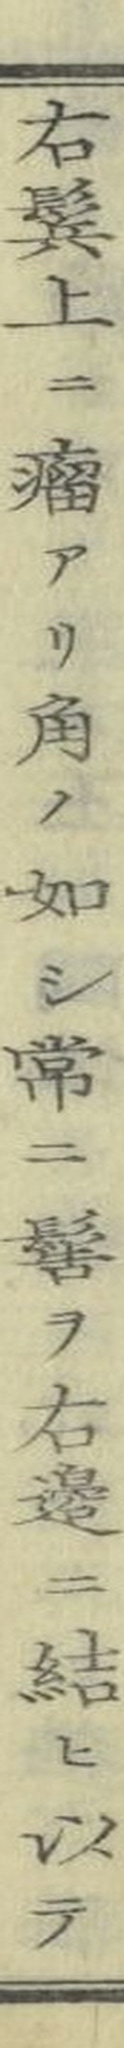右鬂上ニ瘤アリ角ノ如シ常ニ髺ヲ右邉ニ結ヒ以テ
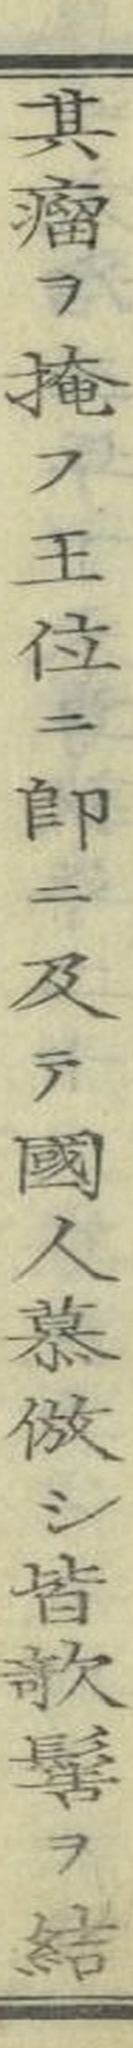其瘤ヲ掩フ王位ニ即ニ及テ國人慕倣シ皆欹髺ヲ結
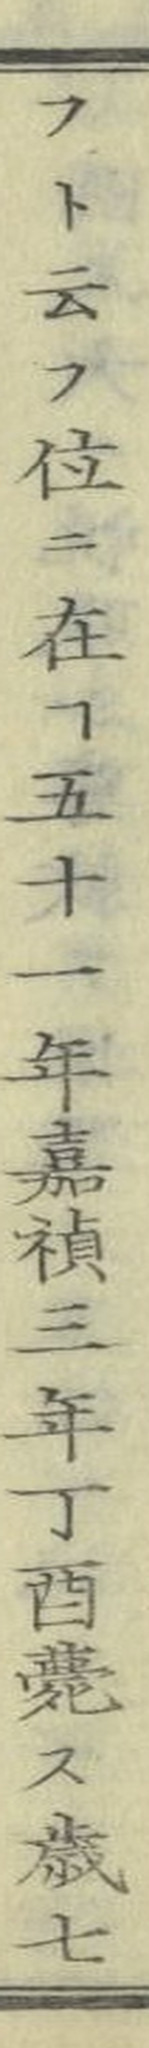フト云フ位ニ在コト五十一年嘉禎三年丁酉薨ス歳七
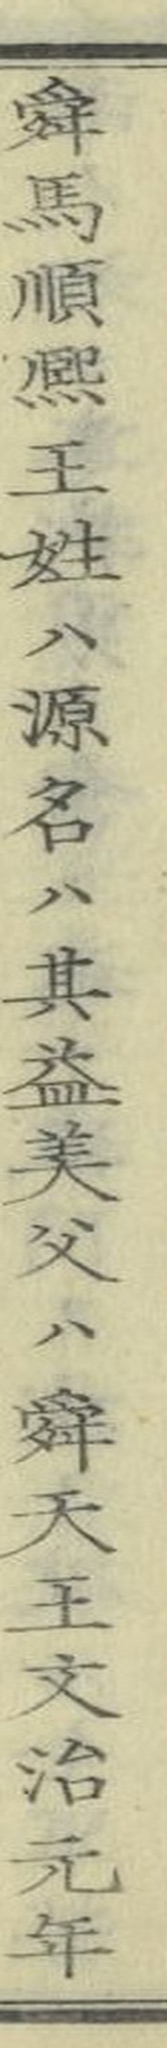舜馬順熙王姓ハ源名ハ其益美父ハ舜天王文治元年
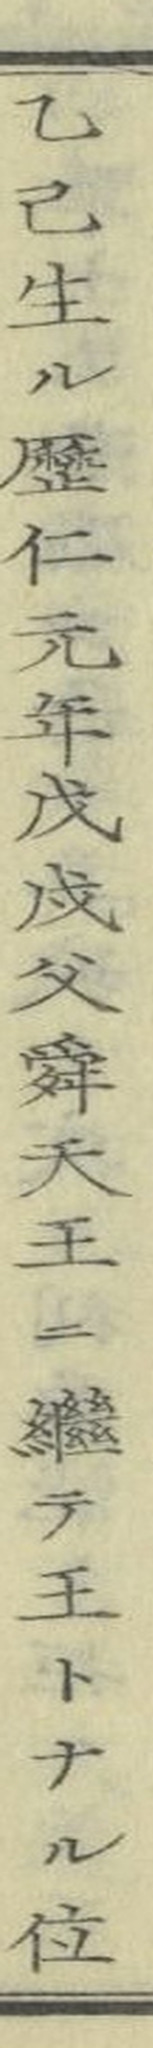乙巳生ル歷仁元年戊戌父舜天王ニ繼テ王トナル位
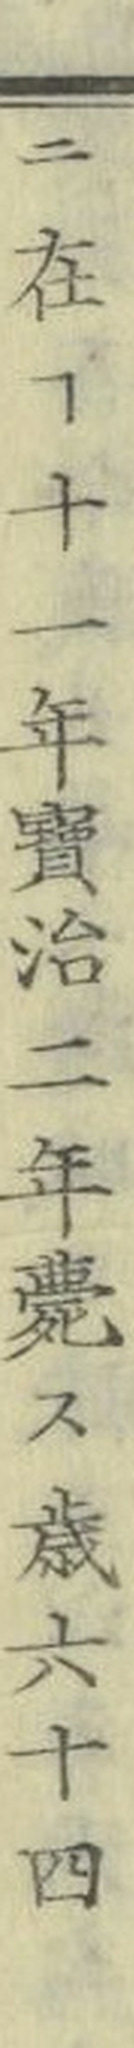ニ在コト十一年寶治二年薨ス歳六十四
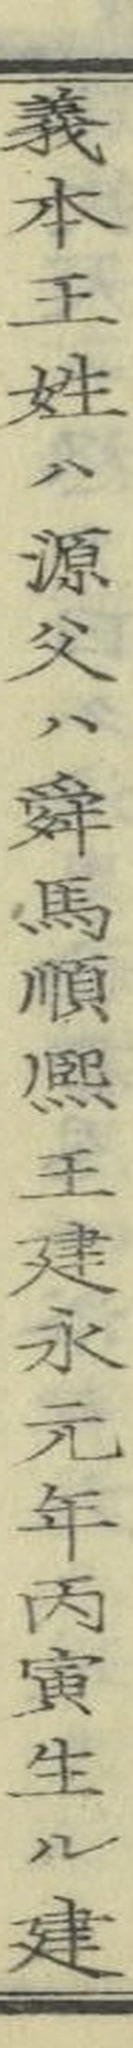義本王姓ハ源父ハ舜馬順熙王建永元年丙寅生ル建
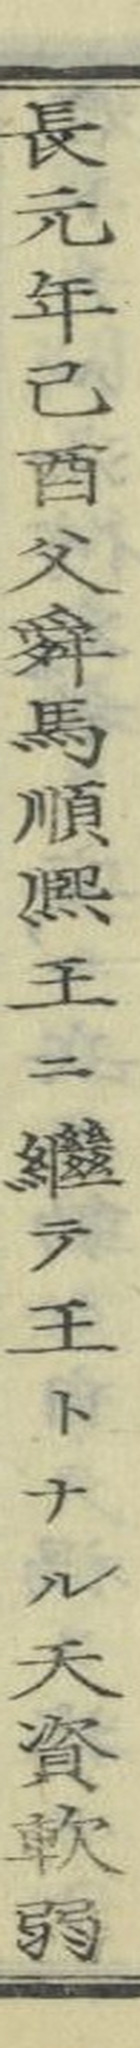長元年己酉父舜馬順熙王ニ繼テ王卜ナル天資軟弱
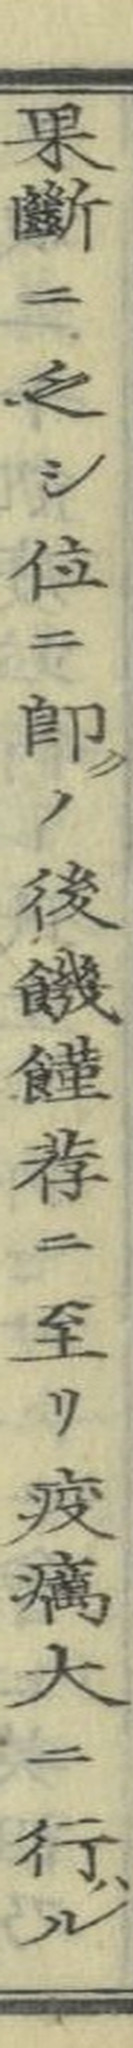果斷ニ乏シ位ニ即ノ後饑饉荐ニ至リ疫癘大ニ行ル
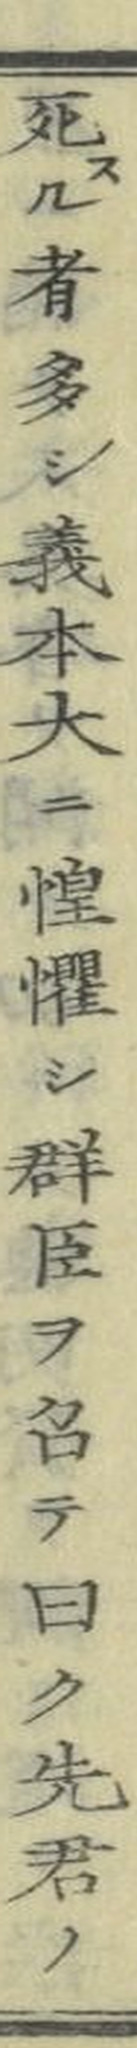死ル者多シ義本大ニ惶懼シ群臣ヲ召テ曰ク先君ノ
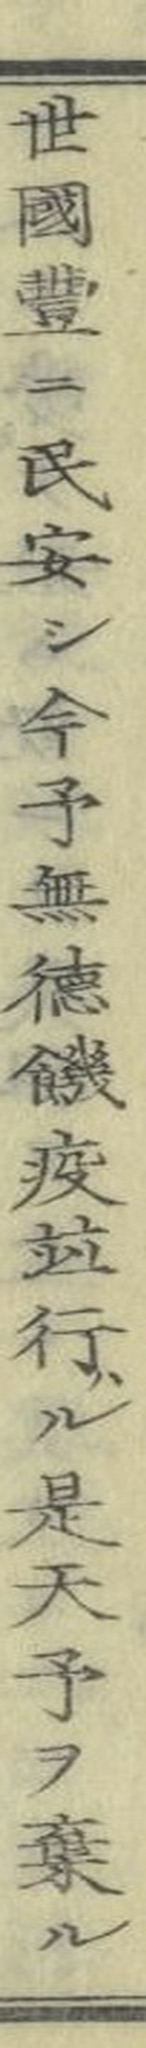世國豐ニ民安シ今予無德饑疫竝行ル是天予ヲ棄ル
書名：琉球藩史 一之巻
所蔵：University of the Ryukyus Library
